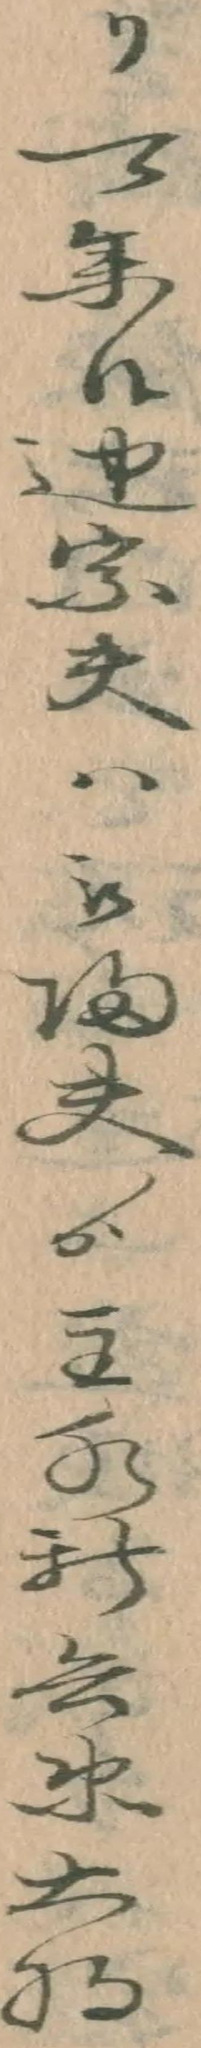り可参候迚宗夫は被帰夫ゟ主水新兵衛大将
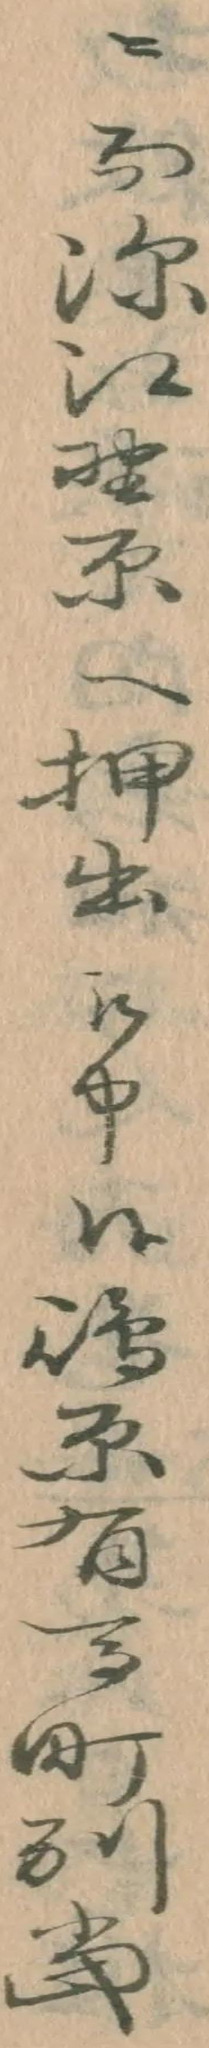に而深江野原へ押出被申候島原有馬町別当
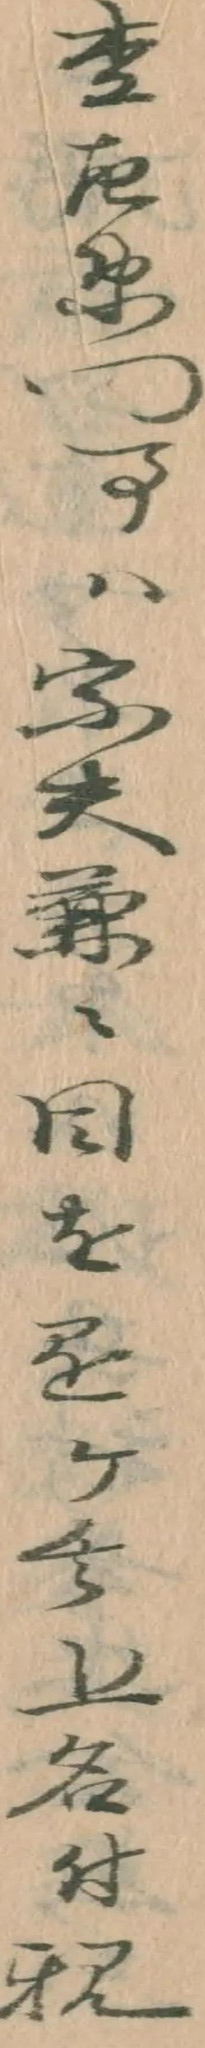杢左衛門事は宗夫兼々目を懸け其上名付親
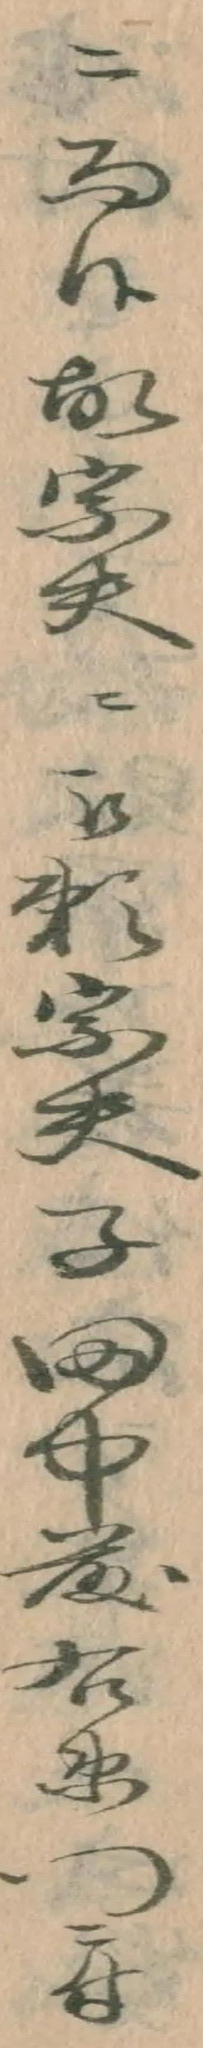に而候故宗夫に被頼宗夫子田中藤右衛門に付
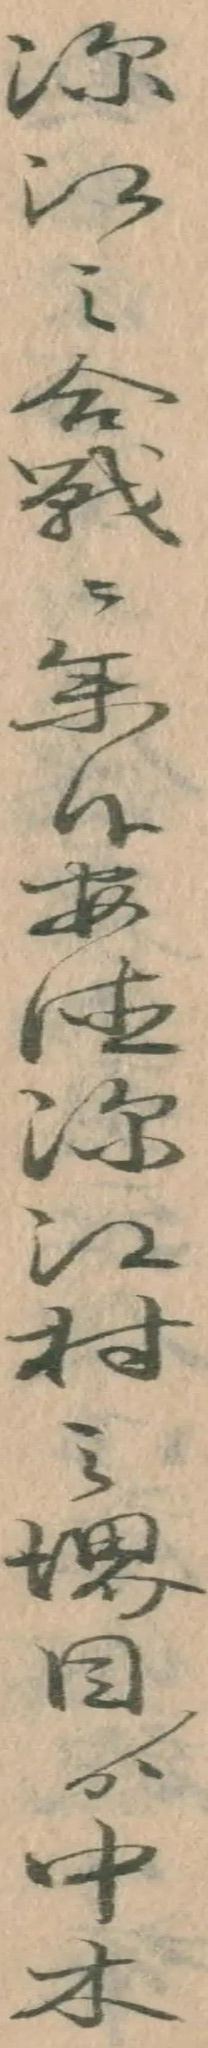深江之合戦に参候安徳深江村之堺目ゟ中木
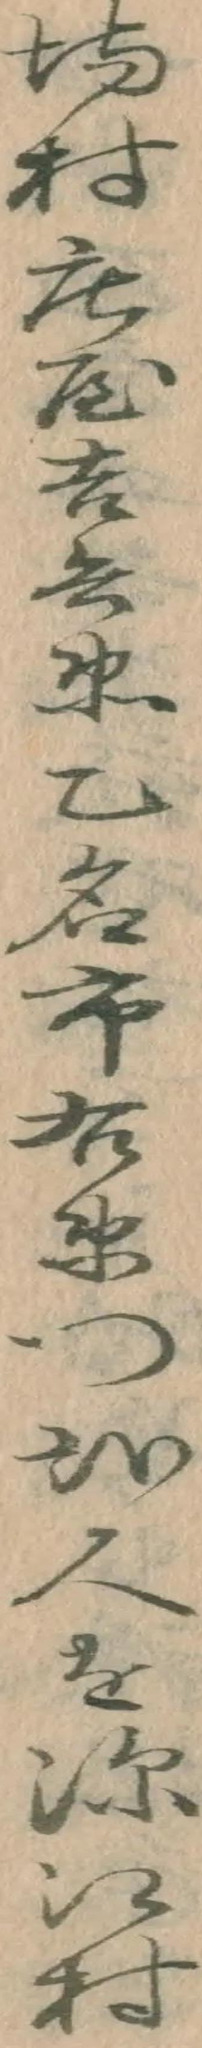場村庄屋吉兵衛乙名市右衛門弐人を深江村
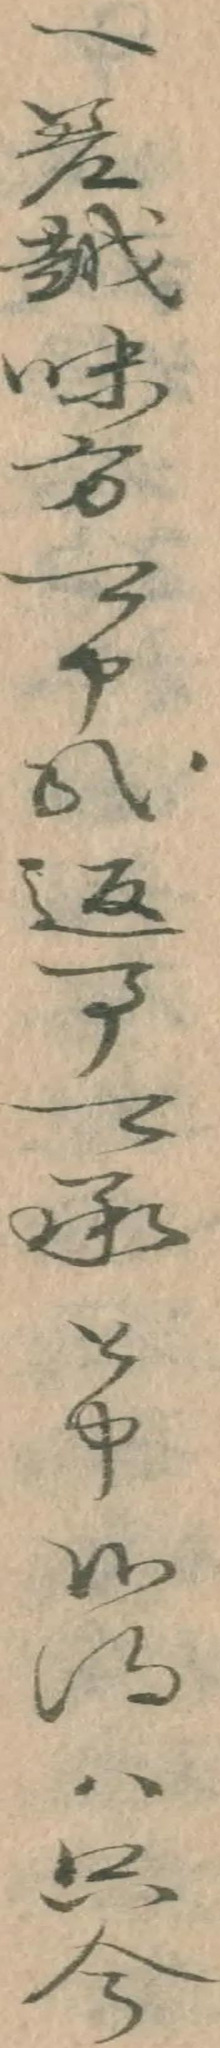へ差越味方可申哉返事可承と申候得は只今
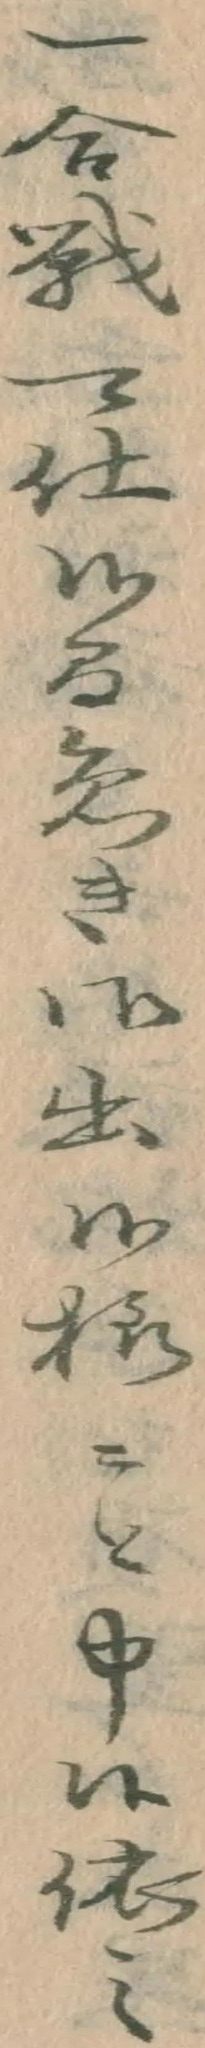一合戦可仕候間急き御出候様にと申候依之
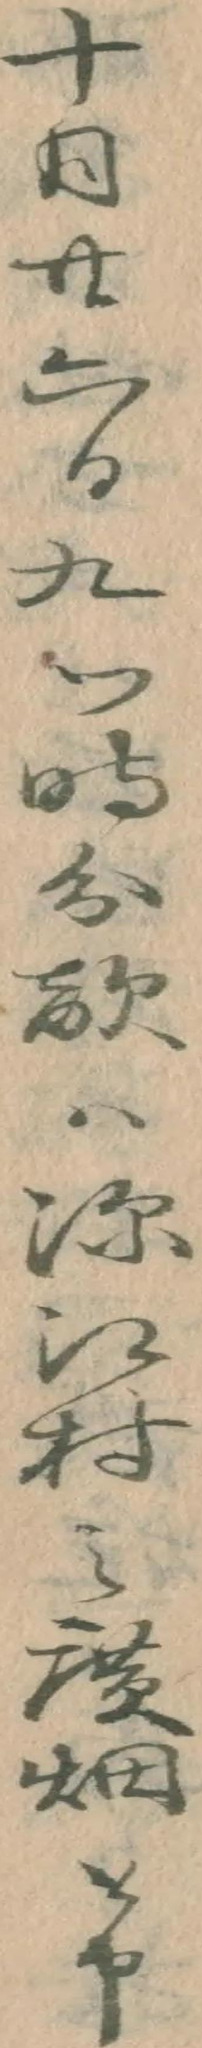十月廿六日九つ時分敵は深江村之広畑と申
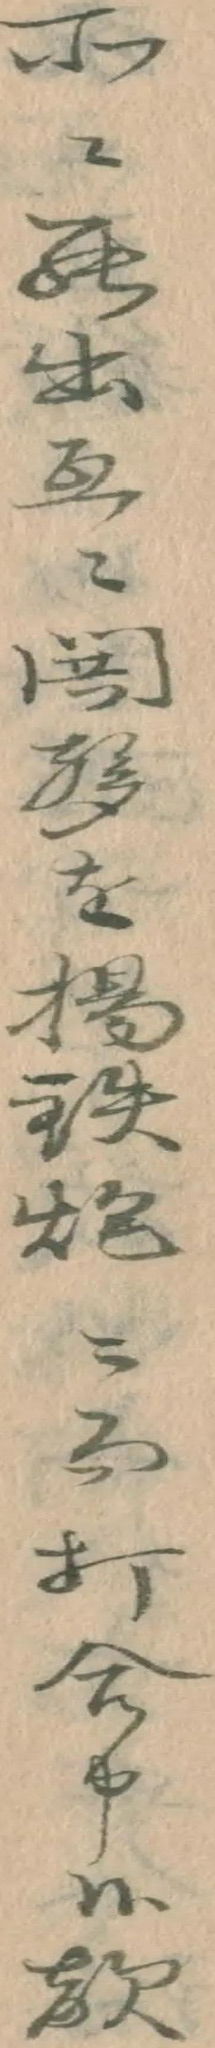所に罷出互に閧声を揚鉄炮に而打合申候敵
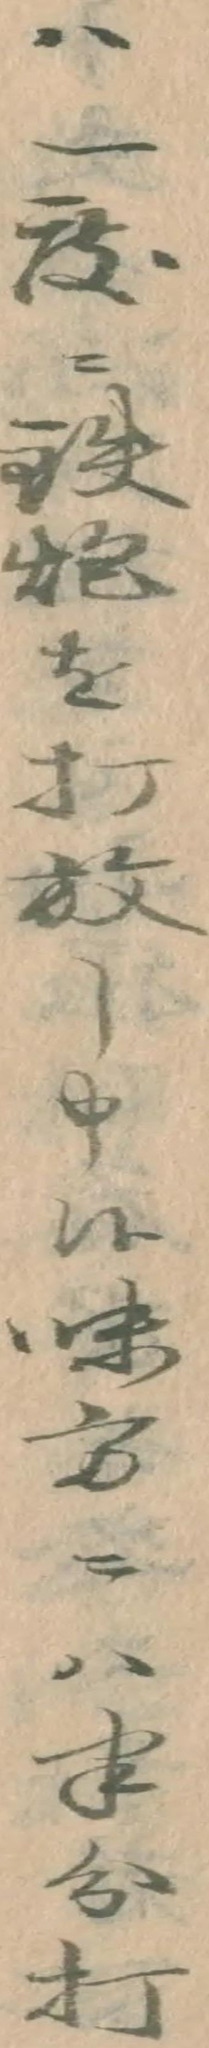は一度に鉄炮を打放し申候味方には半分打
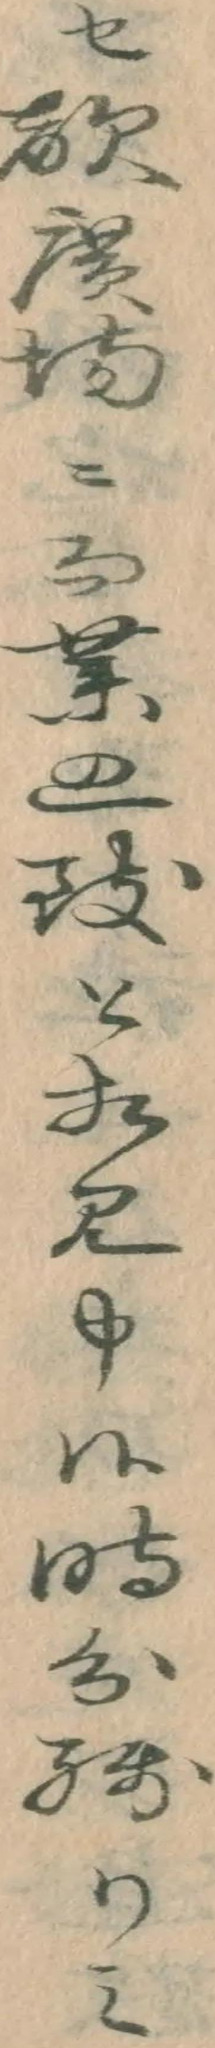せ敵広場に而薬込致と相見申候時分残り之

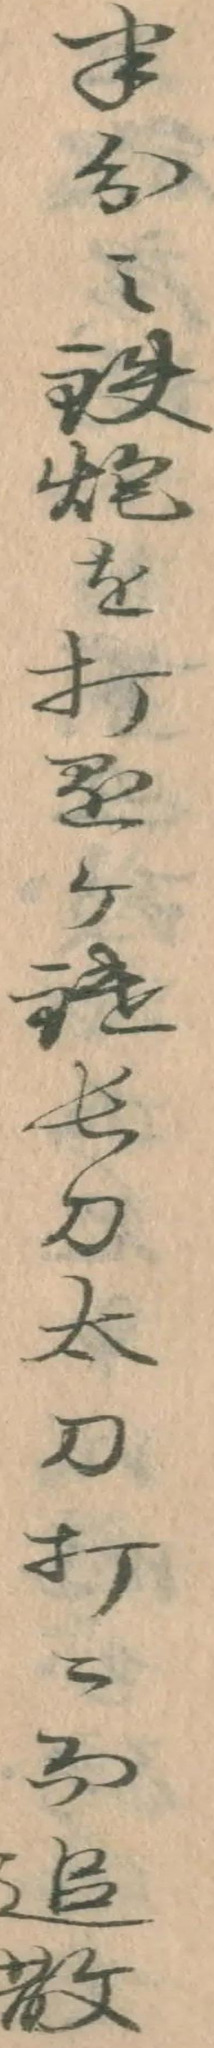半分之鉄炮を打懸け鑓長刀太刀打に而追散
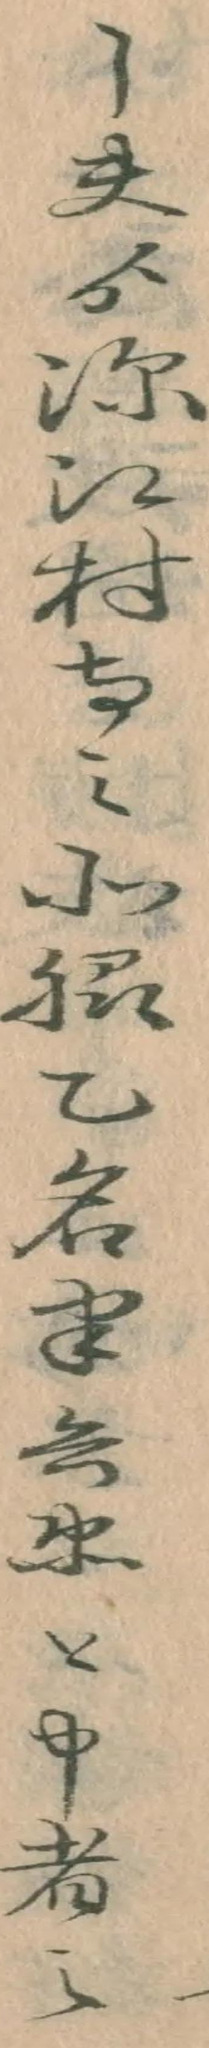し夫ゟ深江村寺之北脇乙名半兵衛と申者之
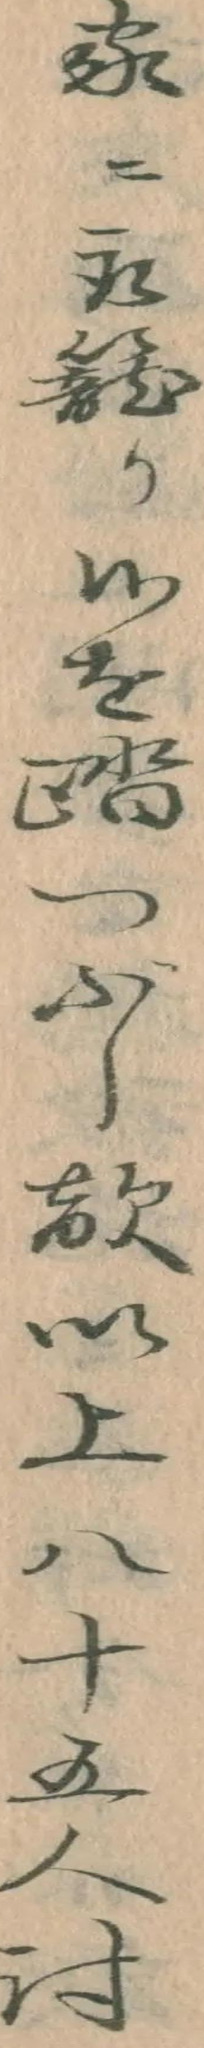家に取籠り候を踏つぶし敵以上八十五人討
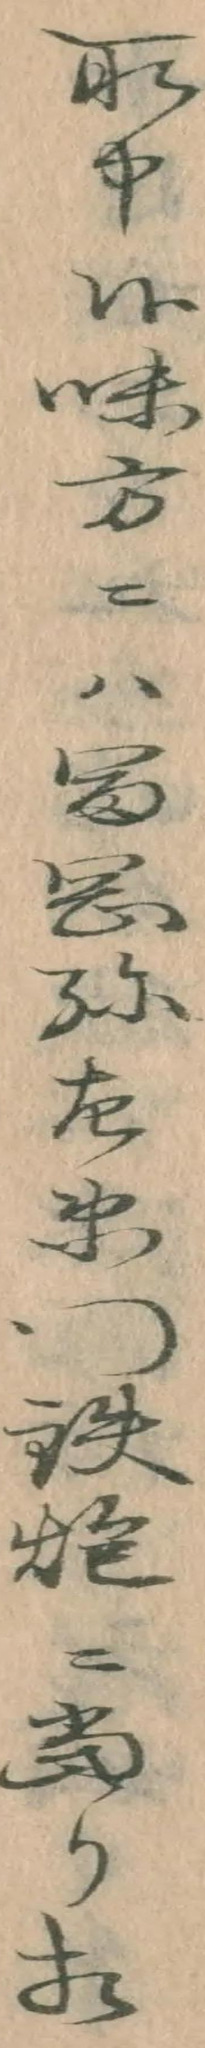取申候味方には富岡弥左衛門鉄炮に当り相
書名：切支丹御退治記 49巻. [1]
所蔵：国立国会図書館 National Diet Library, JAPAN
